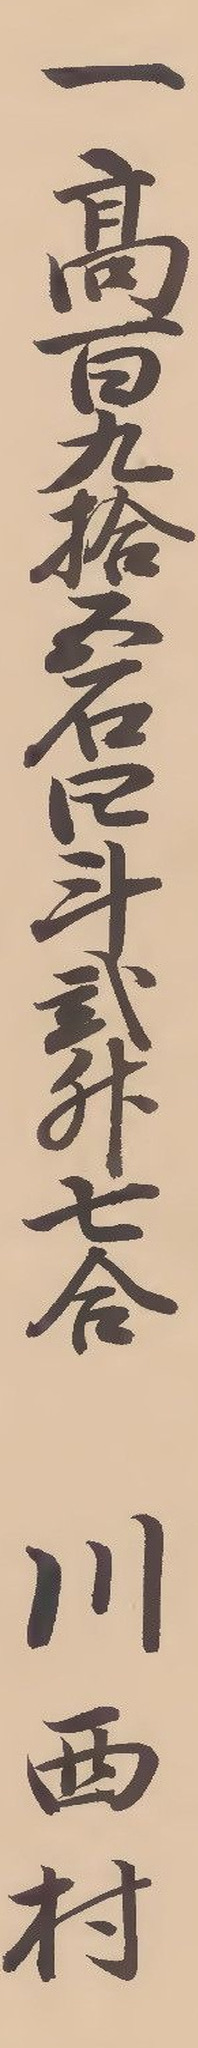一高百九拾五石四斗弐升七合川西村
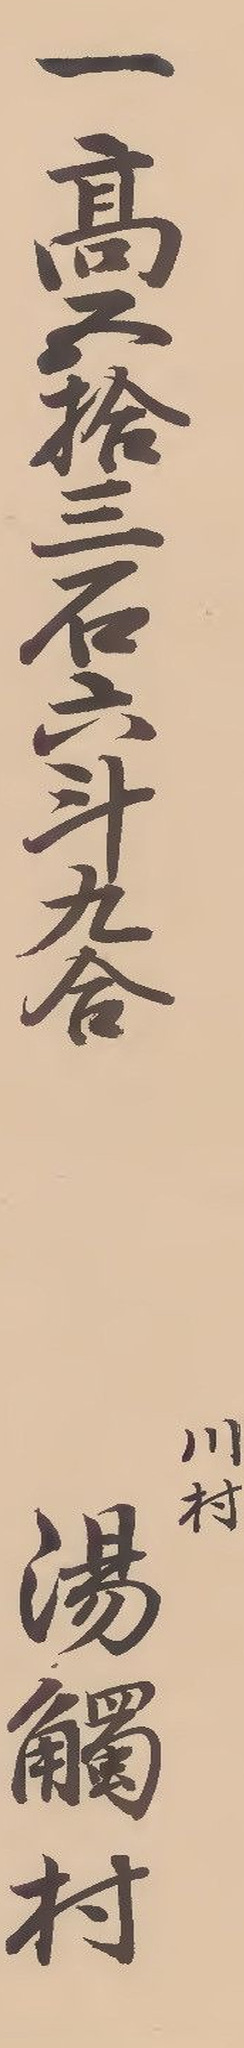一高五拾三石六斗九合湯触村
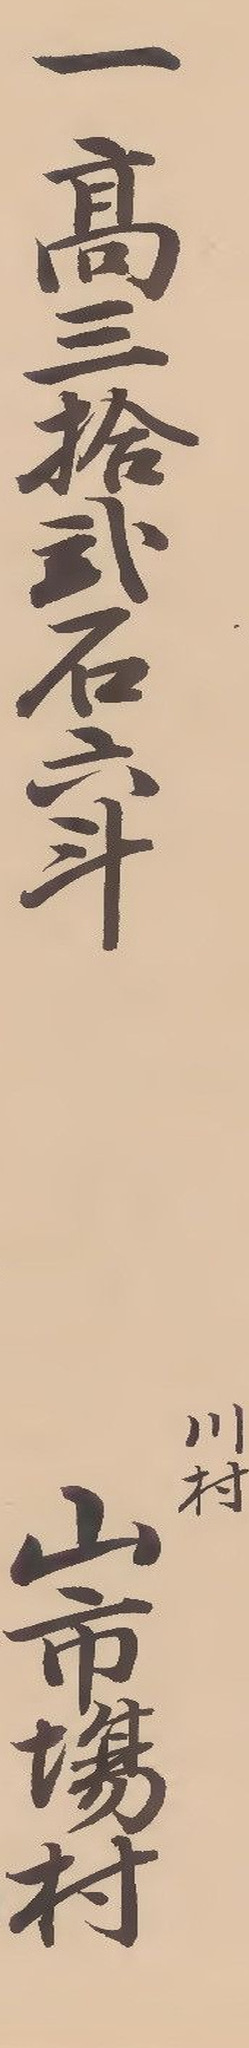一高三拾弐石六斗山市場村
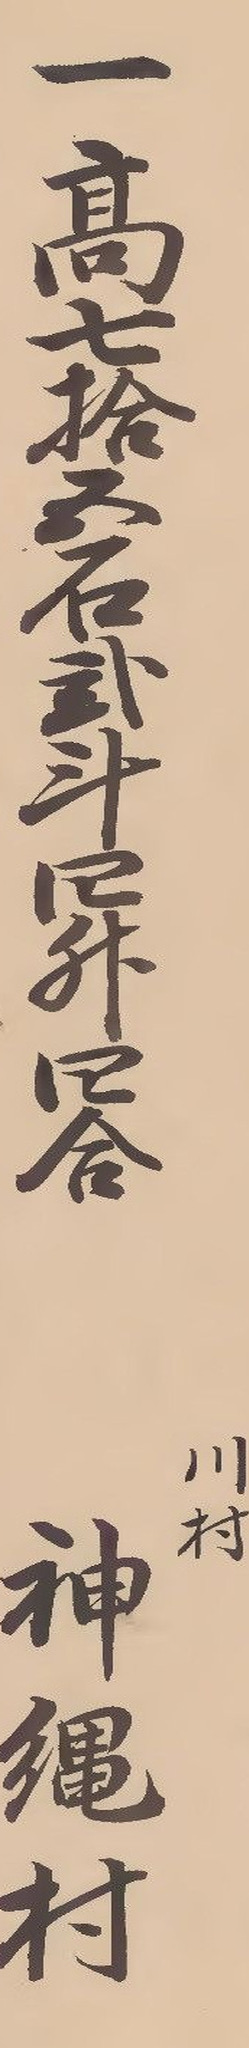一高七拾五石弐斗四升四合神縄村
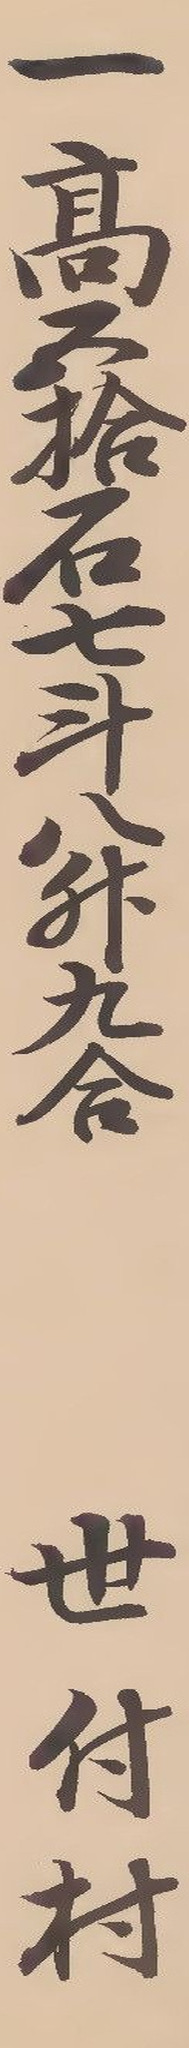一高五拾石七斗八升九合世付村
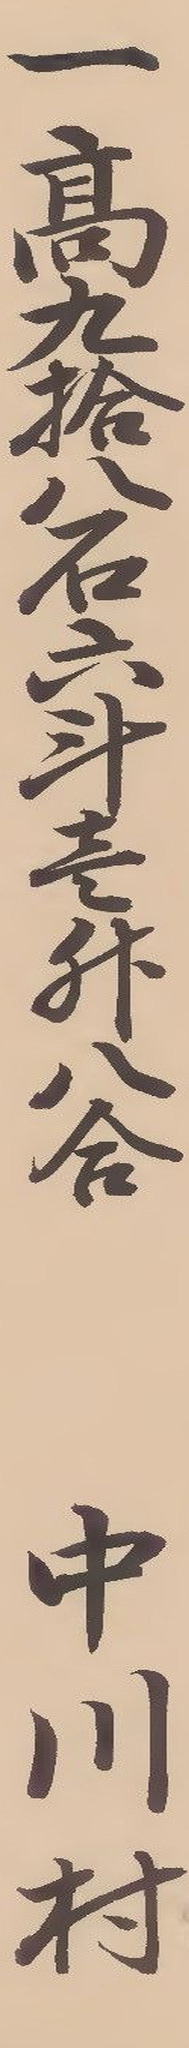一高九拾八石六斗壱升八合中川村
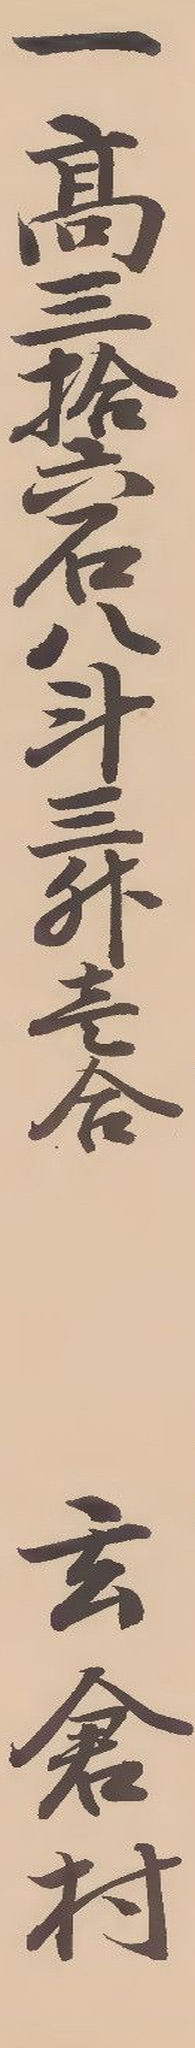一高三拾六石八斗三升壱合玄倉村
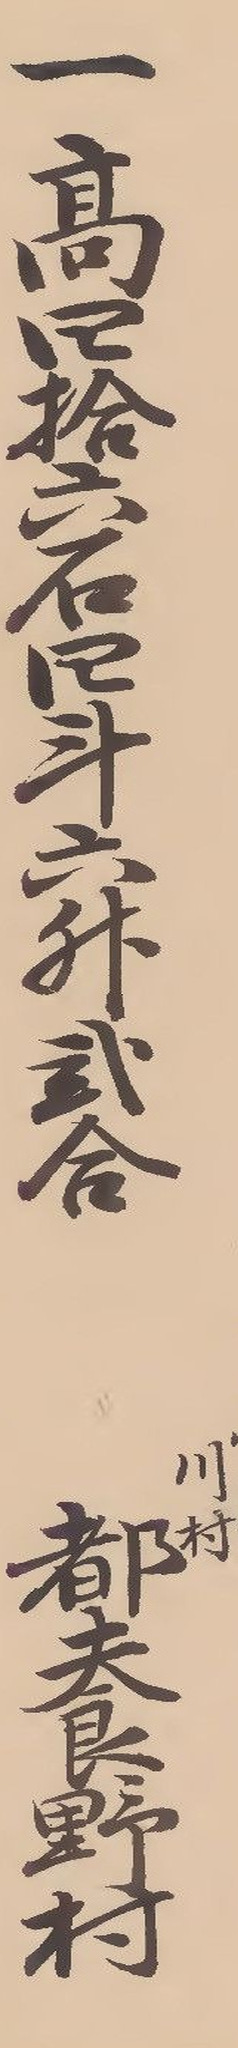一高四拾六石四斗六升弐合都夫良野村

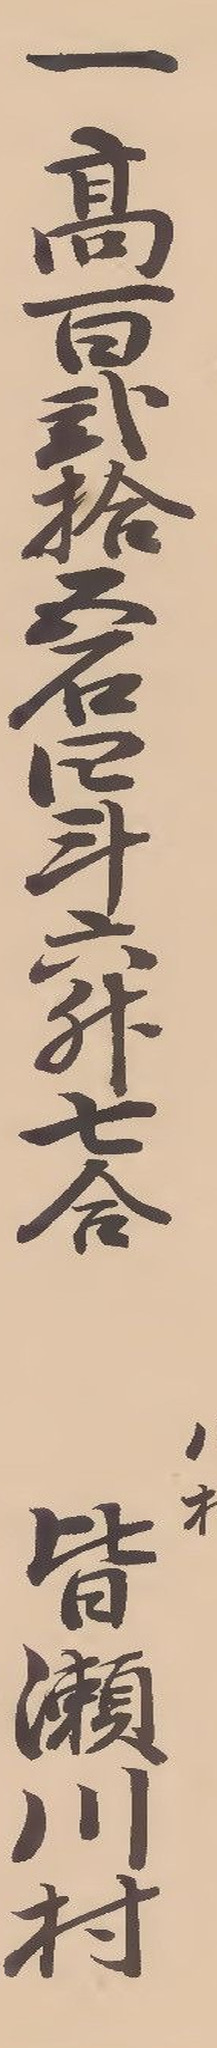一高百弐拾五石四斗六升七合皆瀬川村
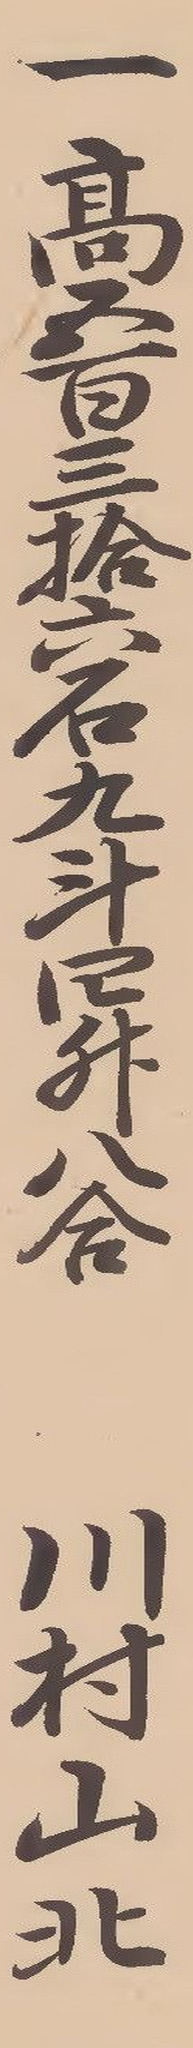一高五百三拾六石九斗四升八合川村山北
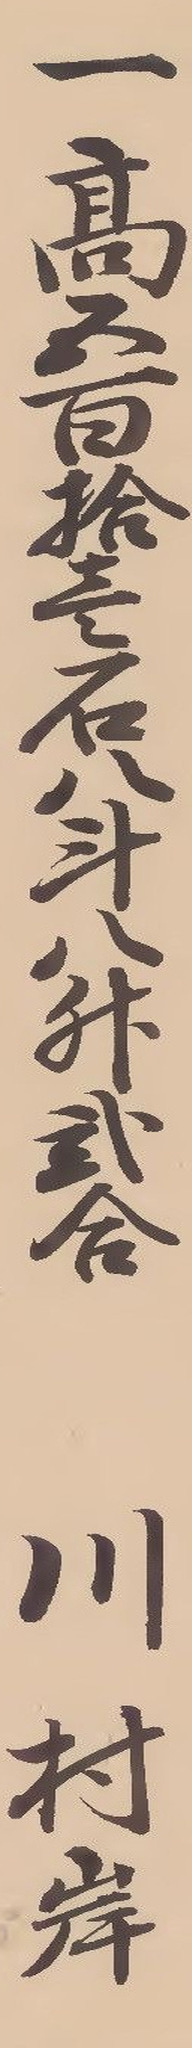一高五百拾壱石八斗八升弐合川村岸
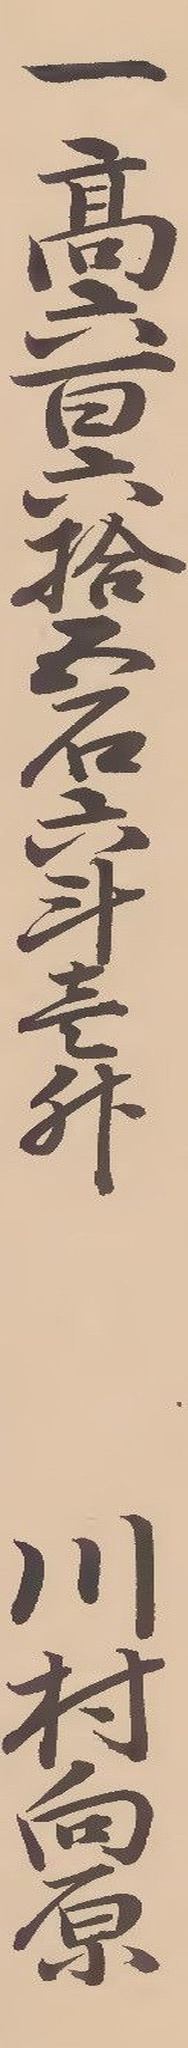一高六百六拾五石六斗壱升川村向原
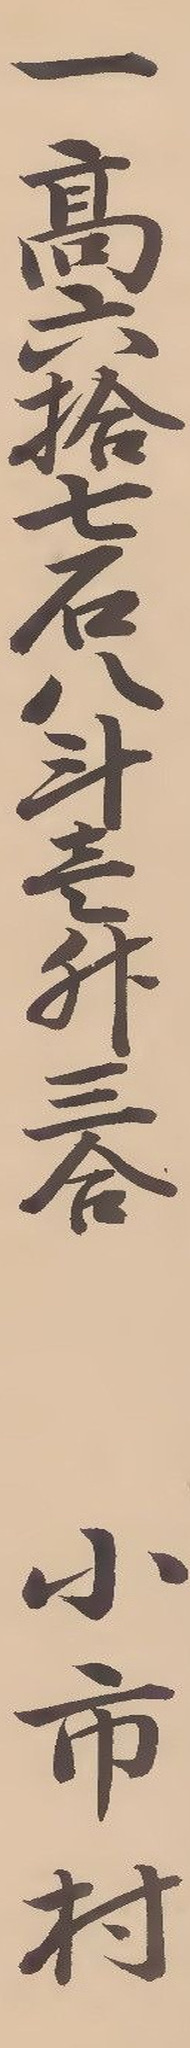一高六拾七石八斗壱升三合小市村
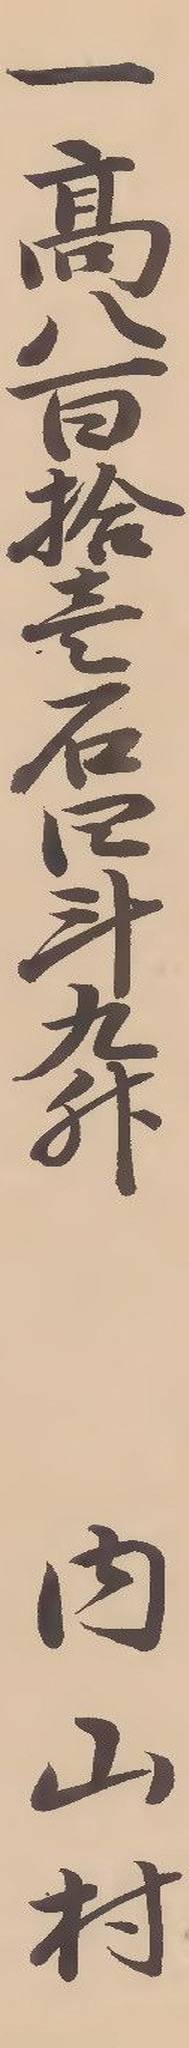一高八百拾壱石四斗九升内山村
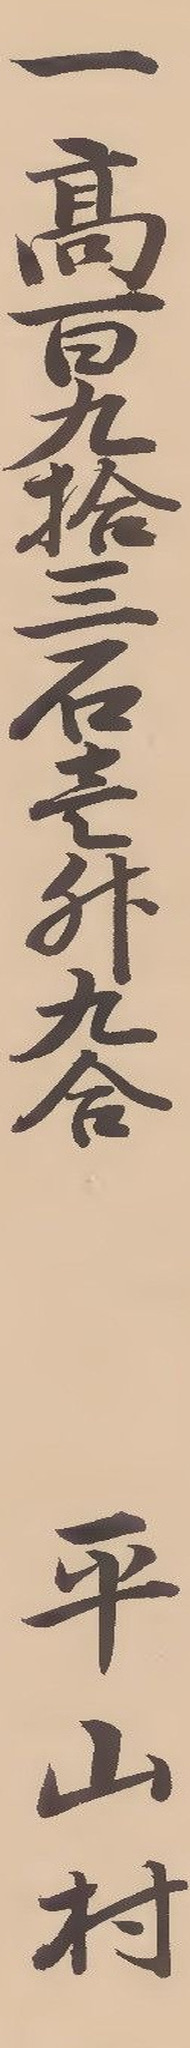一高百九拾三石壱升九合平山村
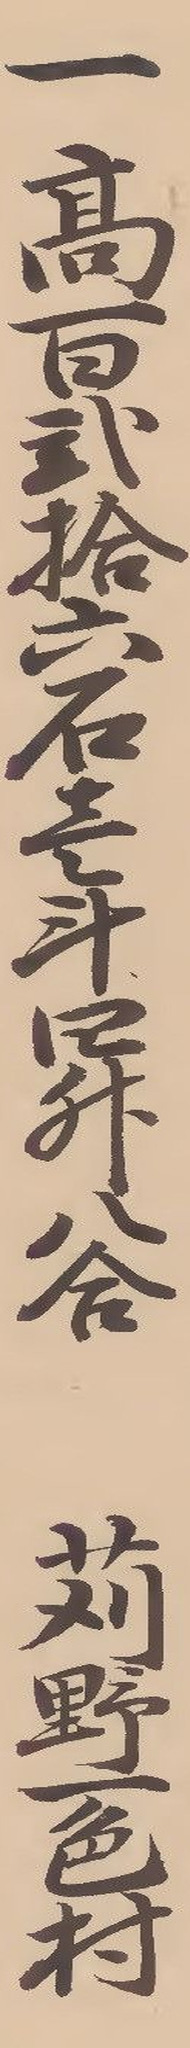一高百弐拾六石壱斗四升八合苅野一色村
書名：相模国郷帳
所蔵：国立公文書館 National Archives of Japan
